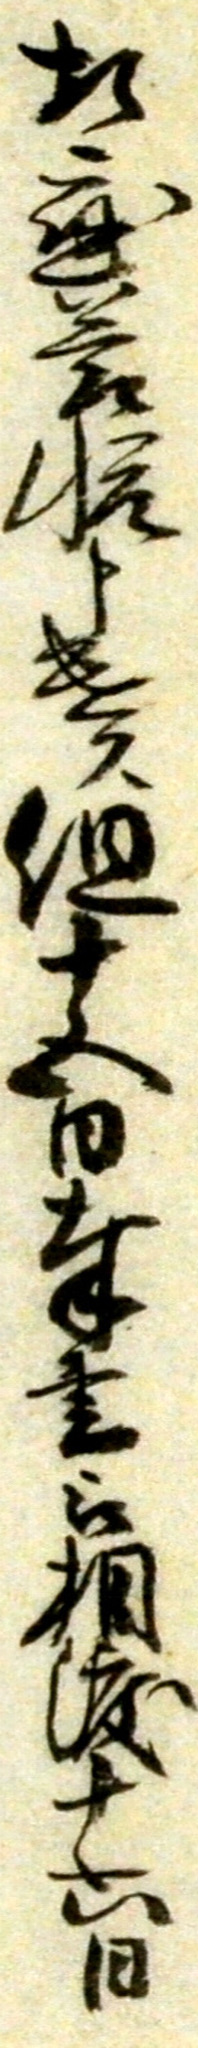相応答悦申遣ス但十五日奉書被相渡十六日
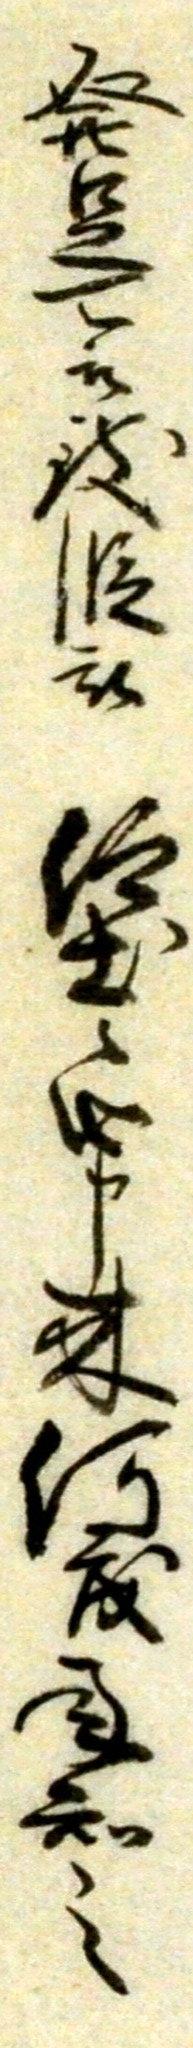発足可被致段被仰出候哉申来何茂承知之
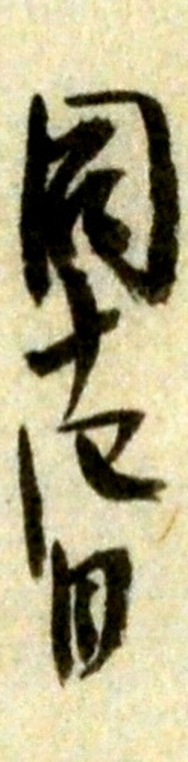同十四日
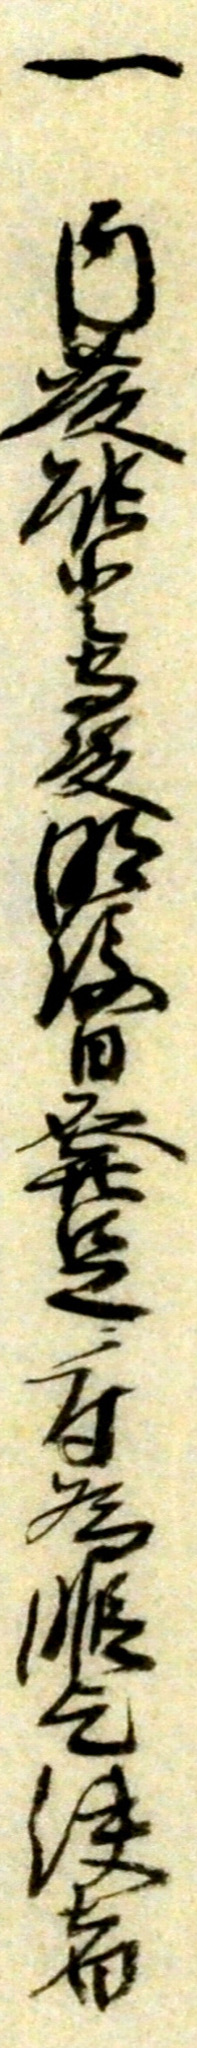一内藤能登守殿明後日発足ニ付為暇乞使者
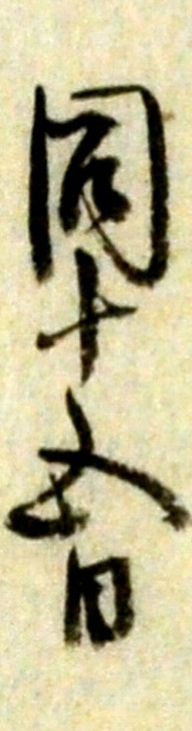同十五日
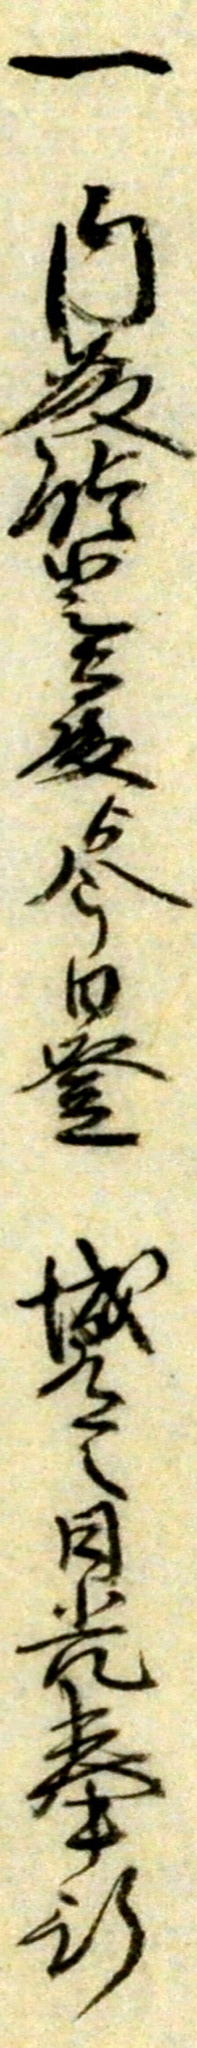一内藤能登守殿ゟ今日登城有之日光奉行
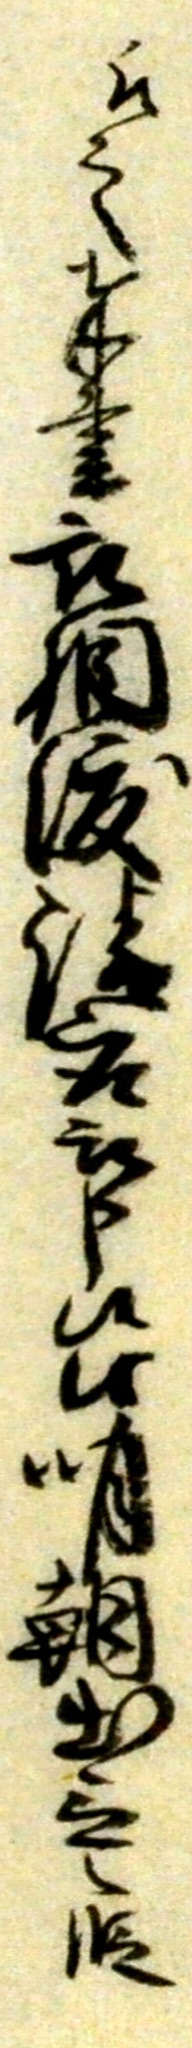江之奉書被相渡請取被申候候明朝出立之段
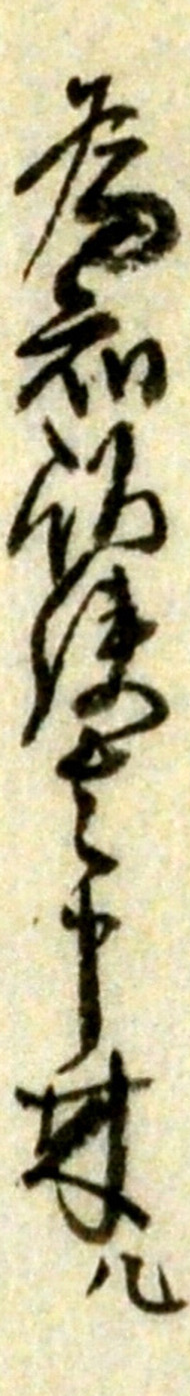為知以使者申来ル
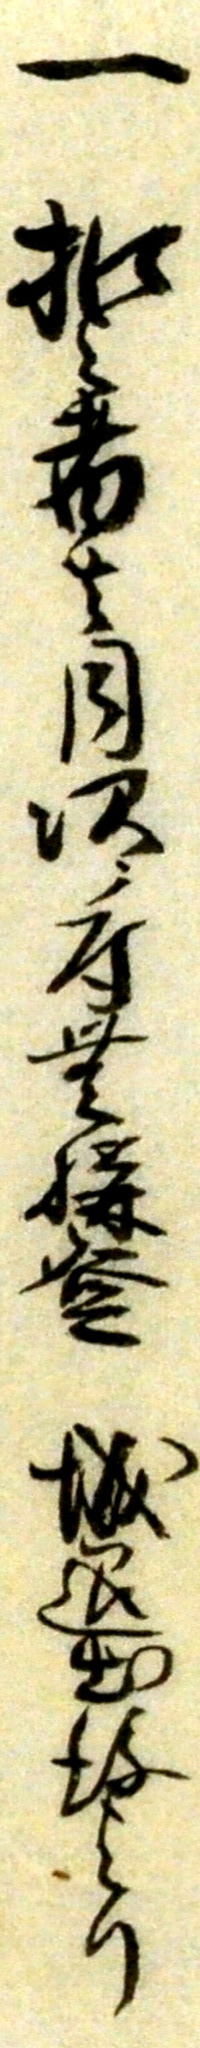一扣之者者月次ニ付無構登城退出後より
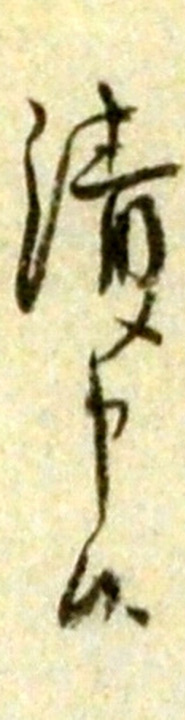清メ申候
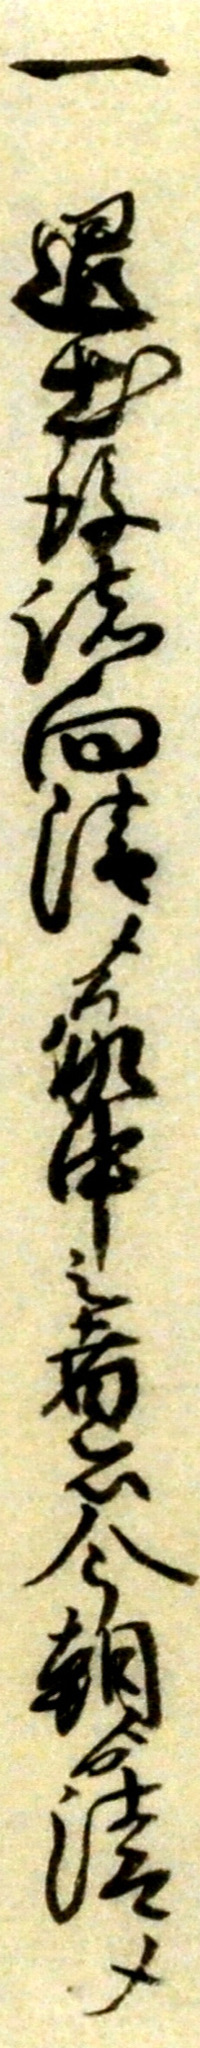一退出後諸向清メ衆中之者者今朝ゟ清メ
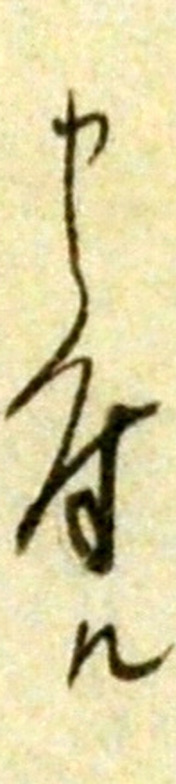申付ル
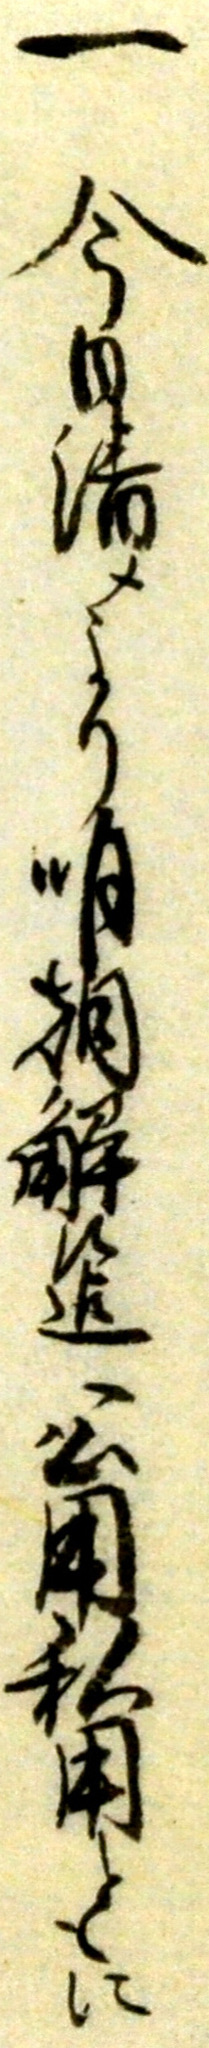一今日清メより明朝解候迠公用私用ともに

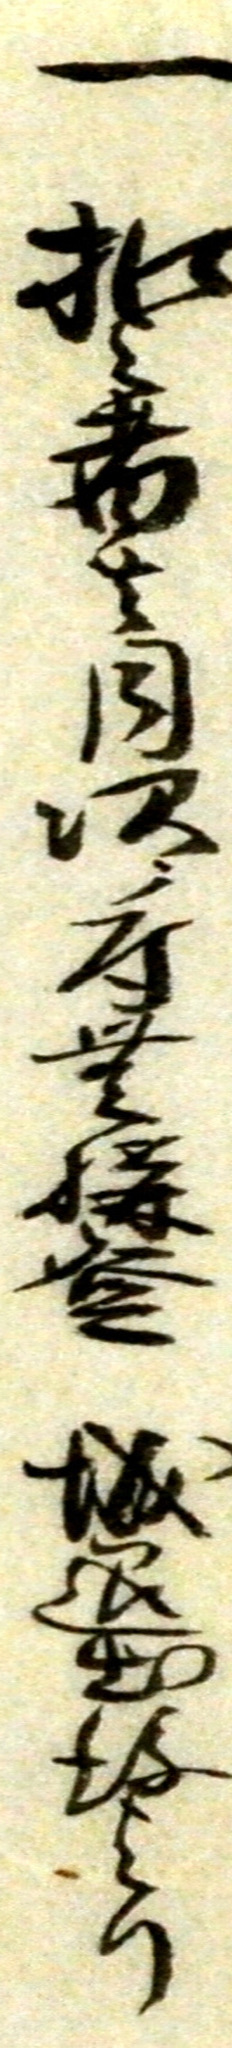一扣番者月次二付無構登城退出後より
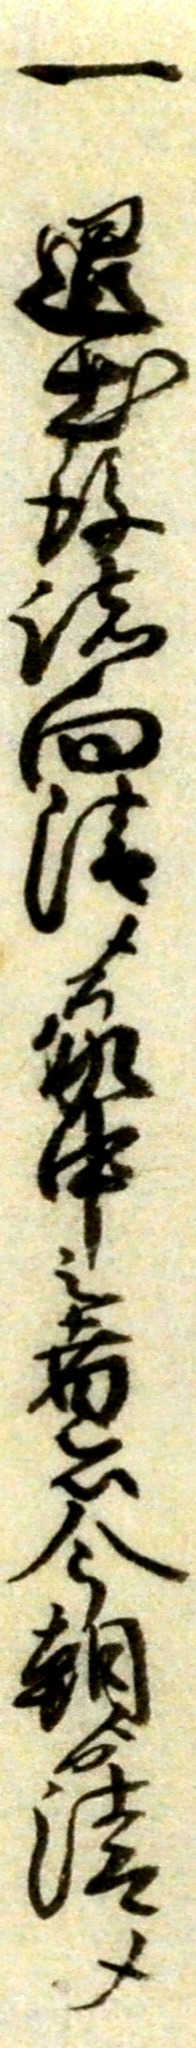一退出後諸向清メ衆中之者者今朝ゟ清メ
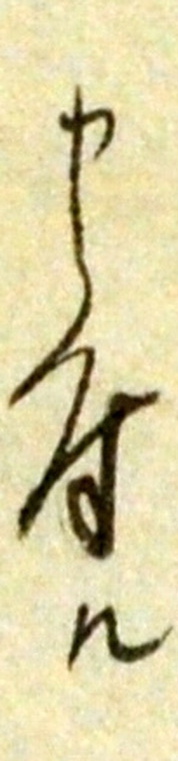申付ㇽ
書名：日光御名代相勤候節ノ留
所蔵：伊那市立高遠町図書館・合同会社AMANE
